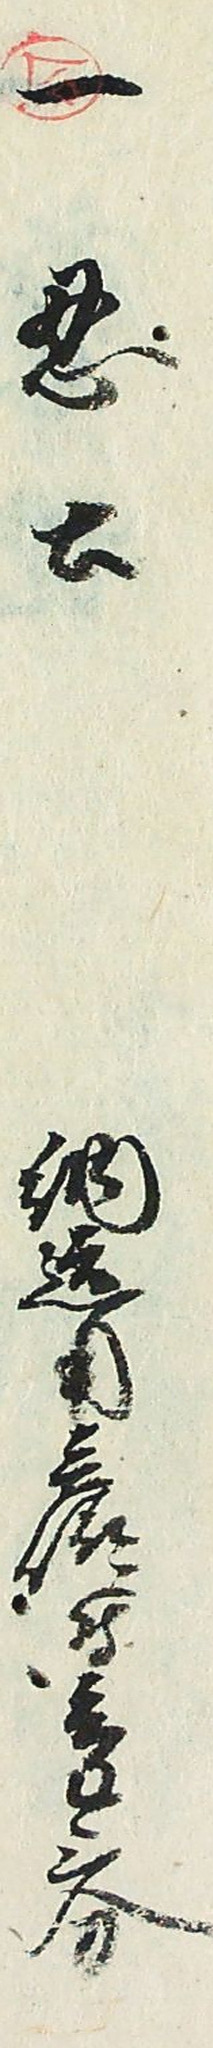一忍土納造用一俵に付一匁三分
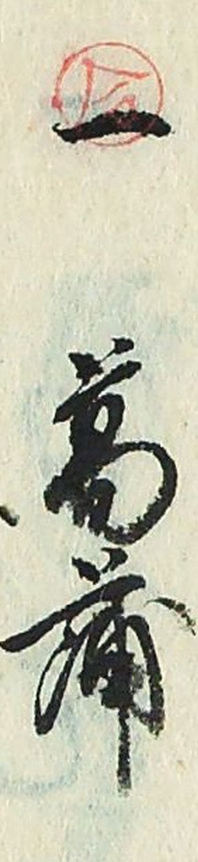一菖蒲
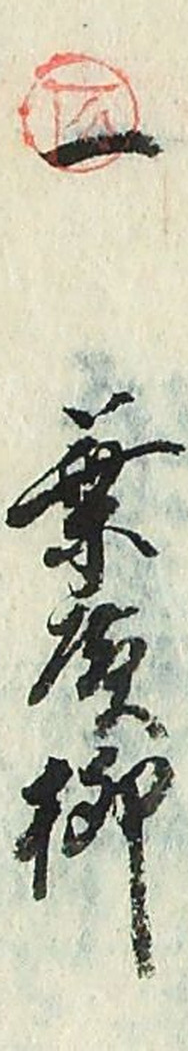一葉広柳
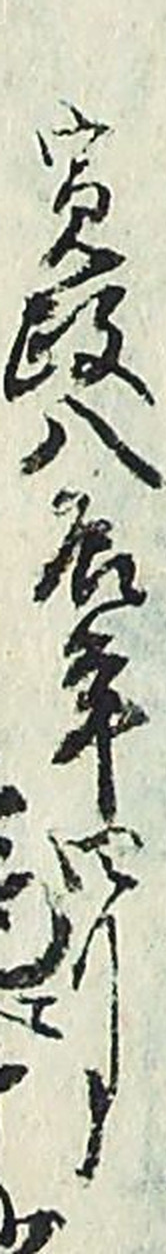寛政八辰年四月
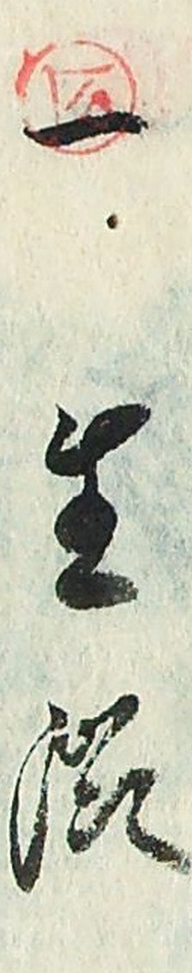一生渋
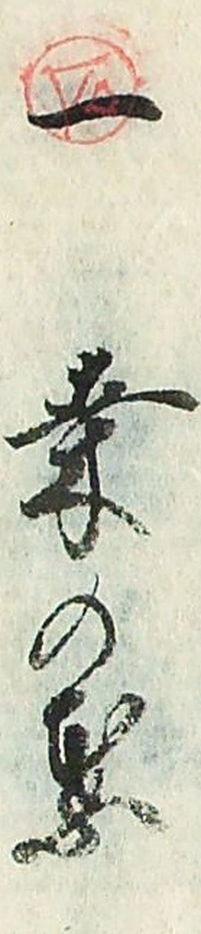一桑の葉

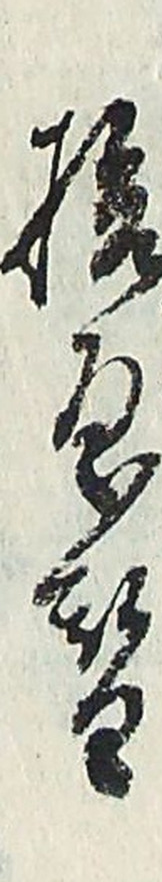十匁替
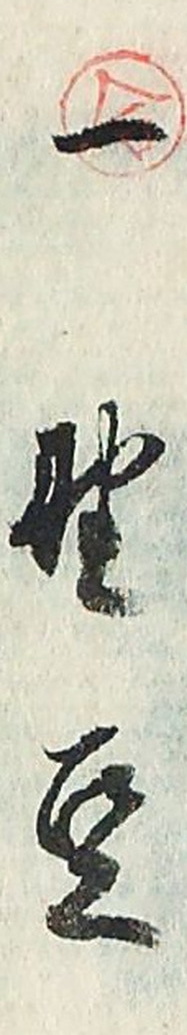一野豆
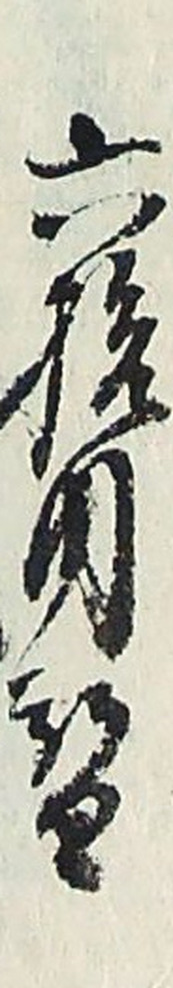六十目替
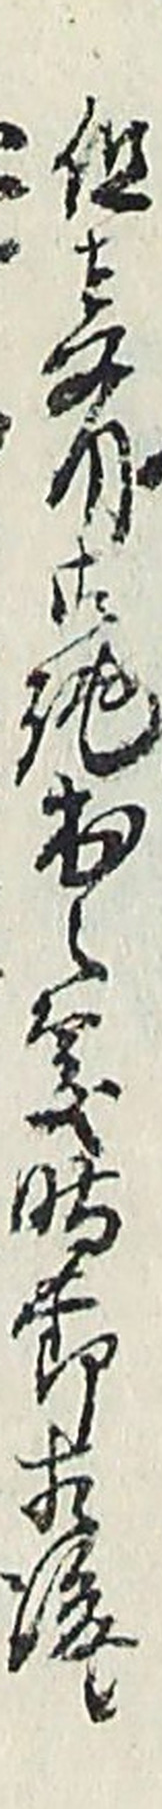但壱貫目御誂出の処時節相後れ
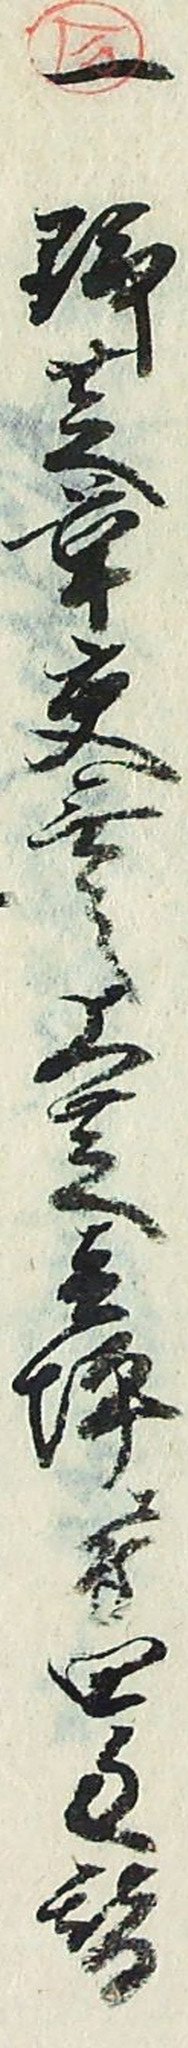一野芝草交無之上芝一坪に付四匁替
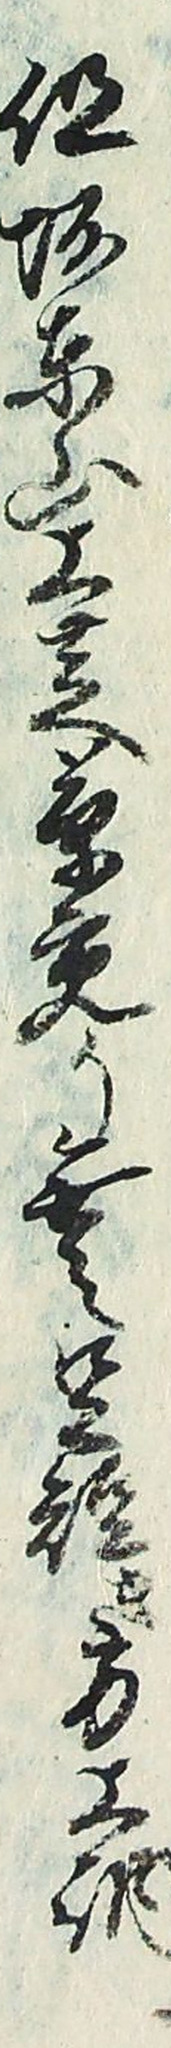但坂東山上芝草交り無之足短キ方上納
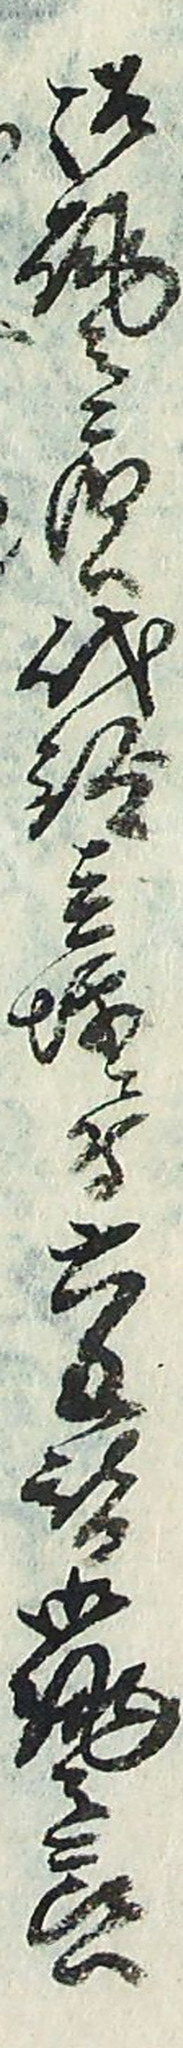御誂の節は代銀一坪に付六匁替御誂の節は
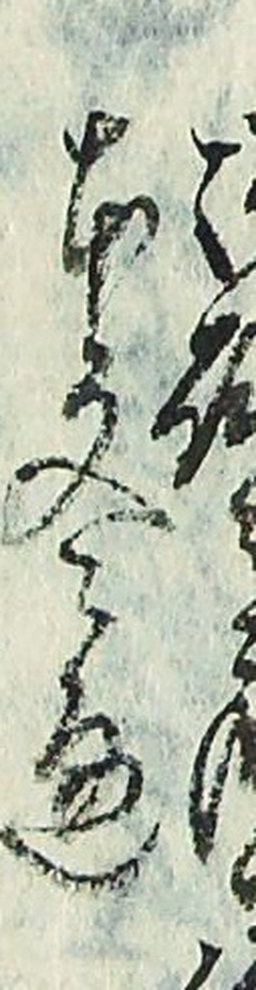本文の通
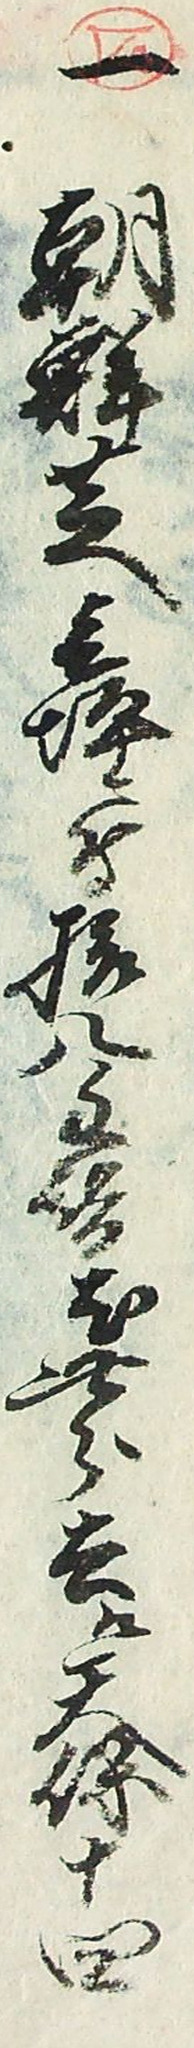一朝鮮芝一坪に付十八匁替尤此分去る天保十四
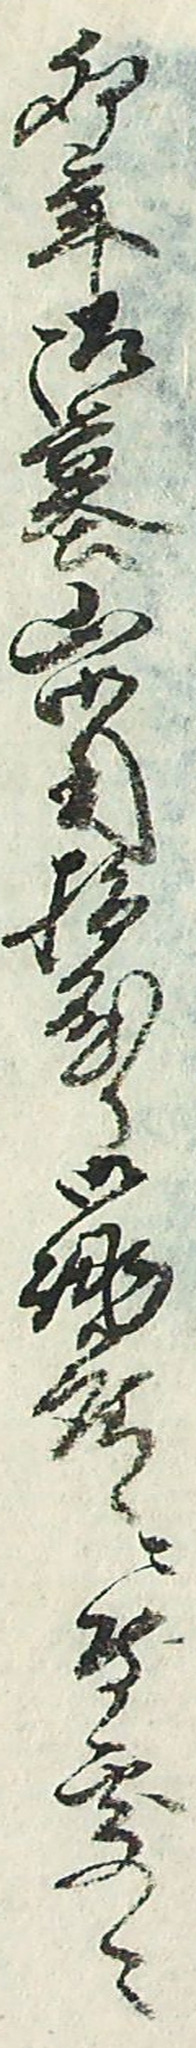卯年御墓山御用指懸り御誂御座候に付処々
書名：諸割賦物賃銀定記録帳
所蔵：鳴門教育大学 Naruto University of Education
